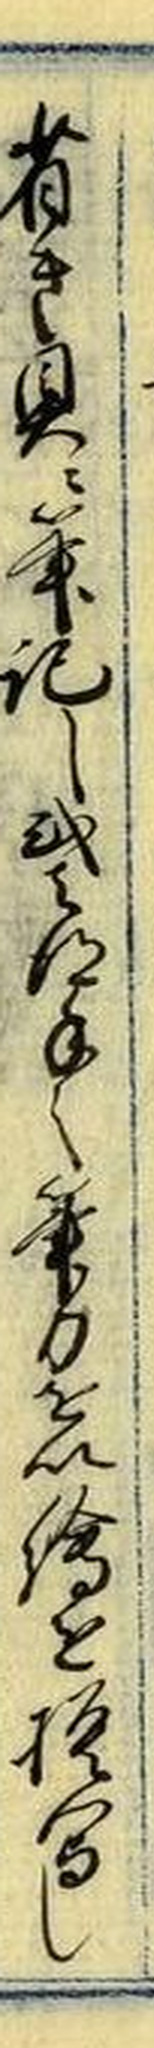省き具に筆記し或は得手之筆力を以絵を模写し
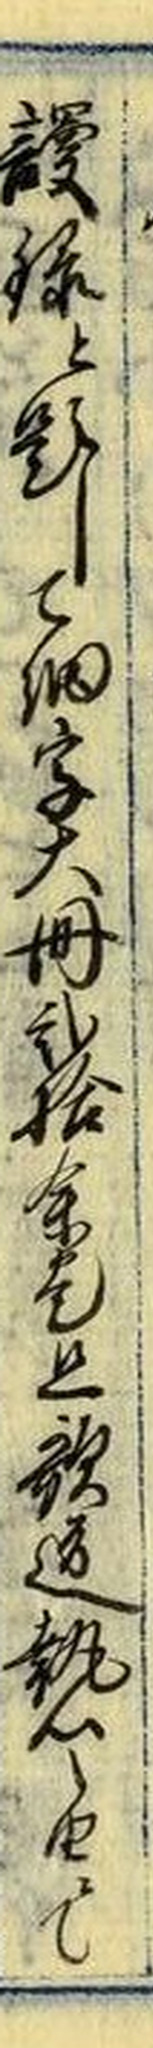謾録と題して細字大冊弐拾余巻且歌道執心之由にて
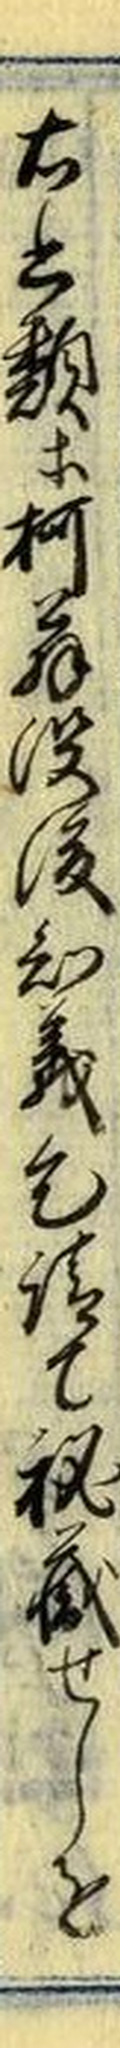右書類等柯翁没後知義乞請て秘蔵せしを
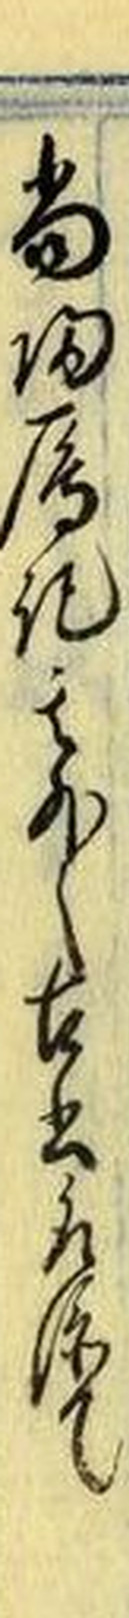尚帰鳫記其外之古書取添て
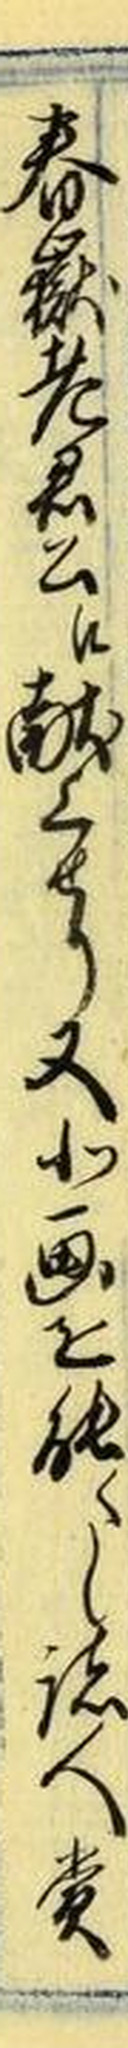春嶽老君公え献上せり又北画を能くし諸人賞
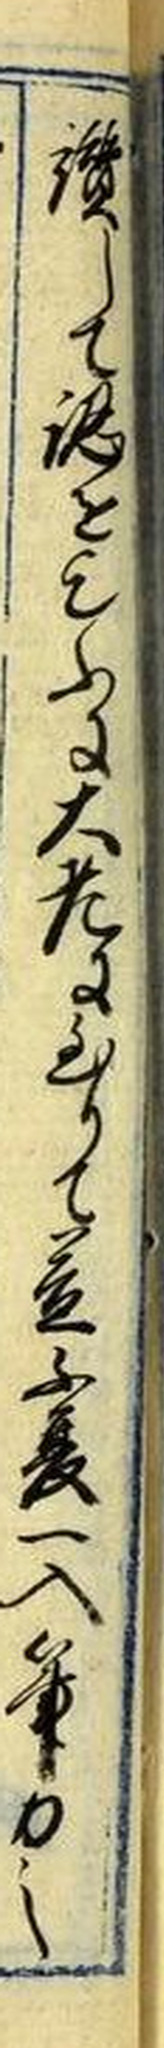讃して認を乞ふに大老に至りて益不一入筆力之
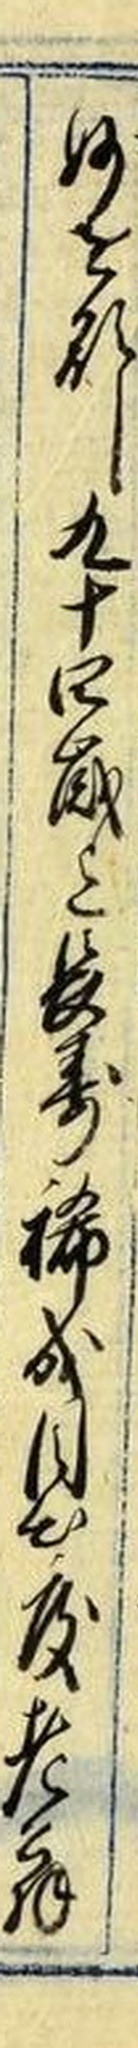妙を顕し九十四歳迄長寿稀成目出度老翁
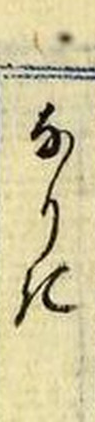なりき
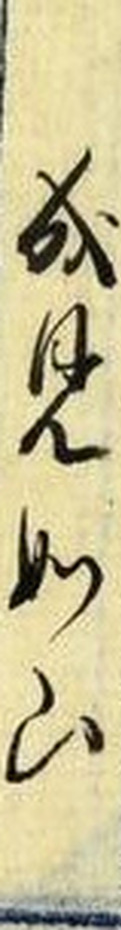成見如山
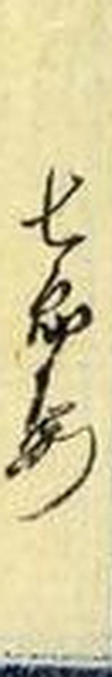七郎右衛門
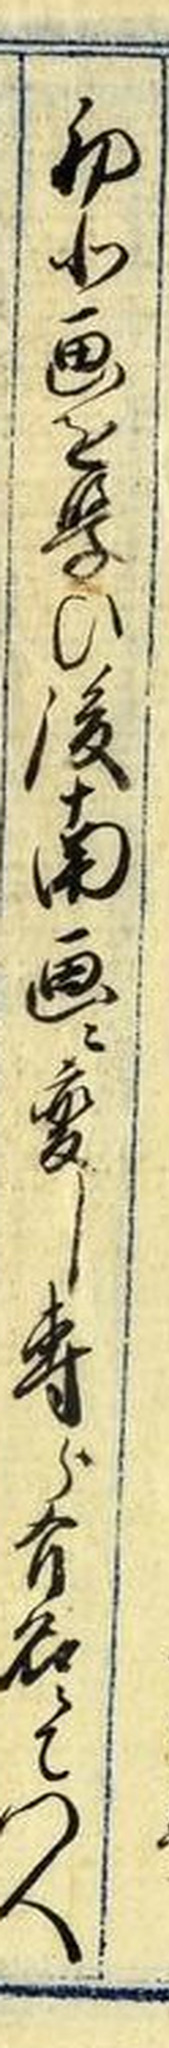初北画を学ひ後南画に変し専ら有名にて門人
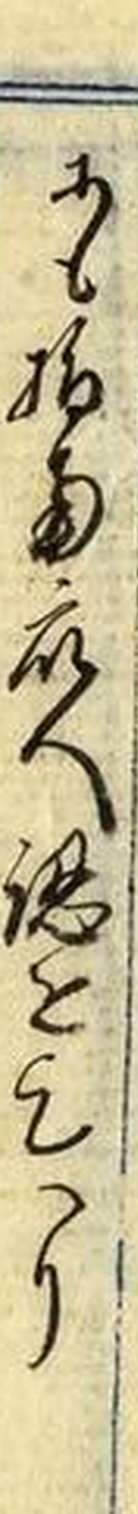にも指南衆人認を乞へり
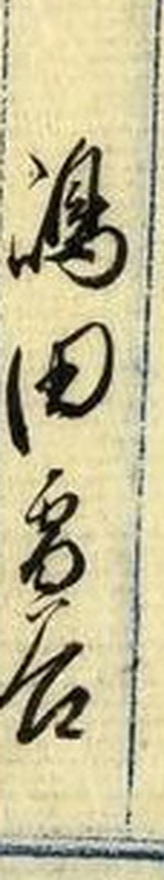嶋田雪谷
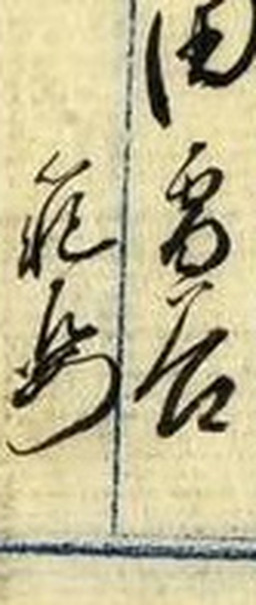範左衛門
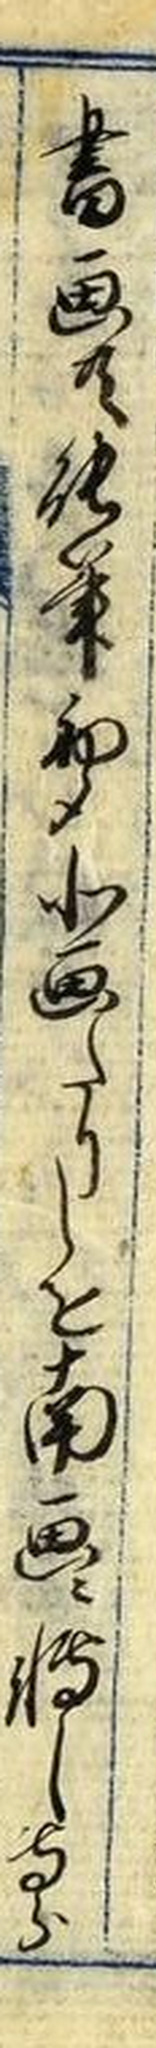書画共能筆初め北画たりしを南画に転し専ら

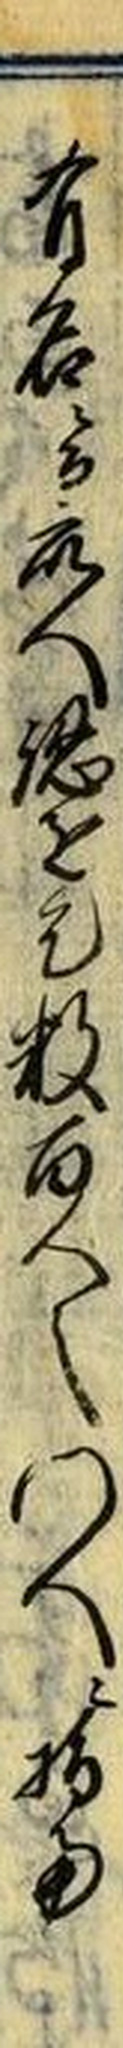有名に而衆人認を乞数百人之門人に指南
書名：温古集 四巻
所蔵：福井県文書館 Fukui Prefectural Archives
